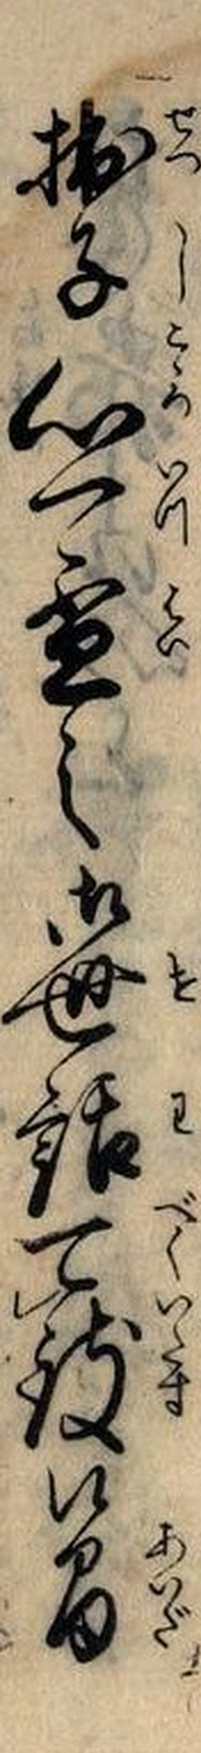拙子心一盃之御世話可致候間
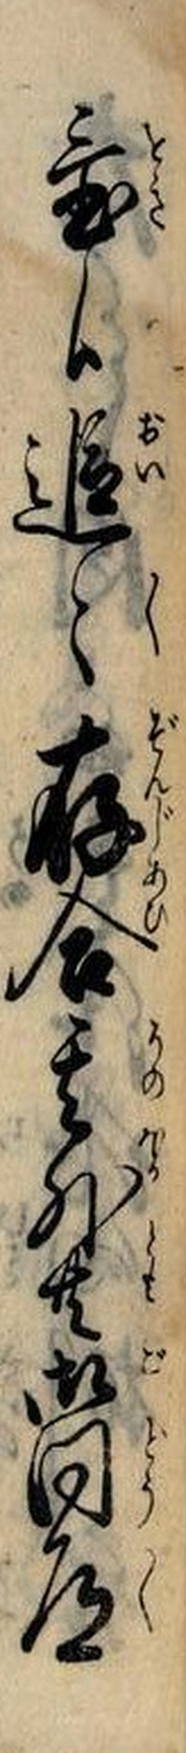置候追々存合其外共御同道
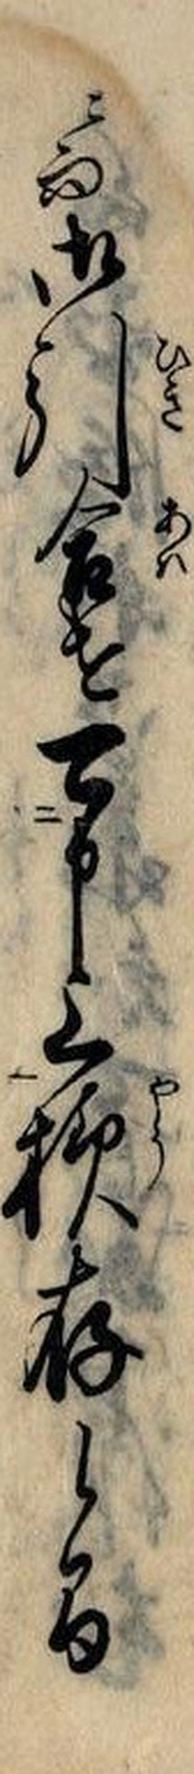に而御引合せ可申上様存候間
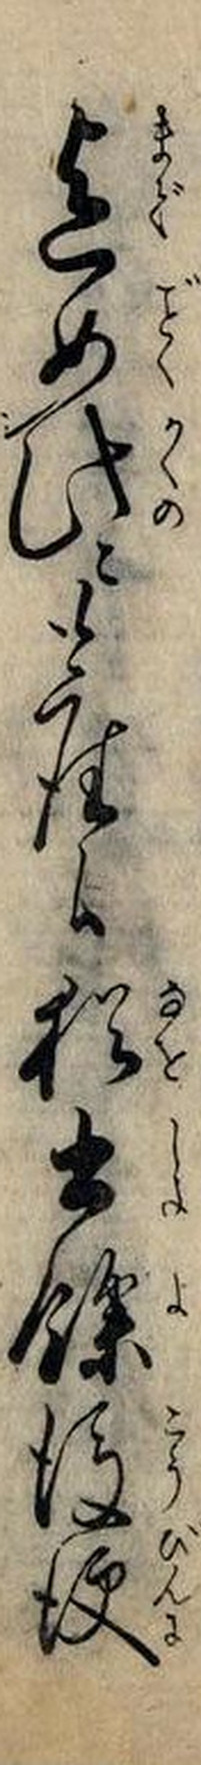迄如此に御座候猶書餘後便
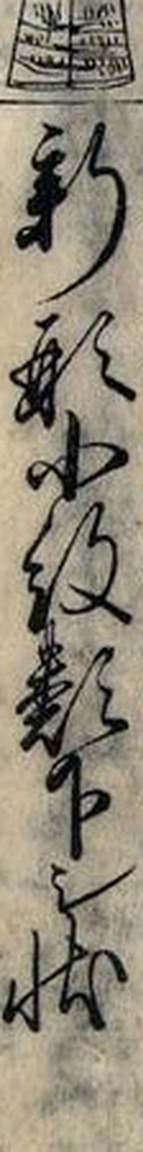新形小紋類下シ状

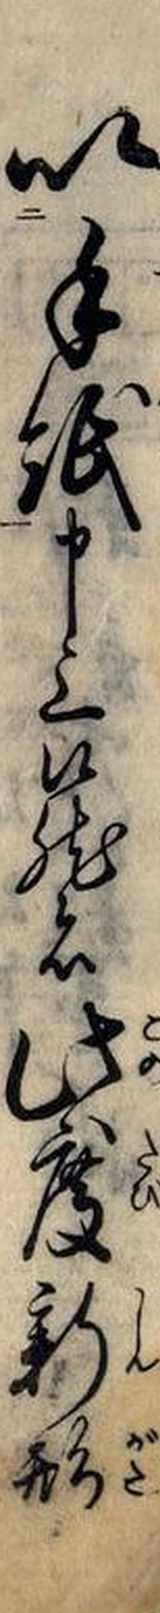以手紙申上候然者此度新形
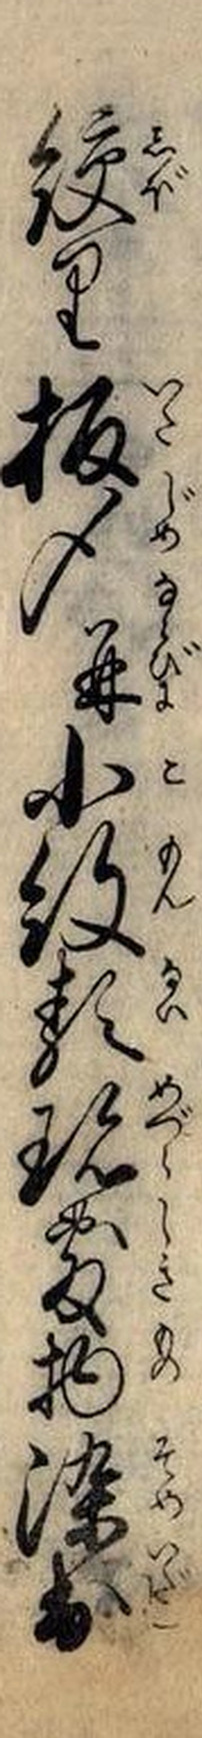絞り板〆并小紋類珍敷物染出
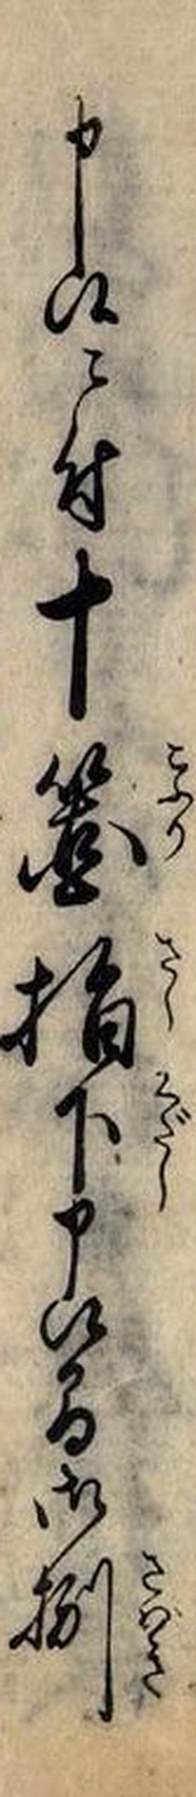申候に付十箇指下申候間御捌
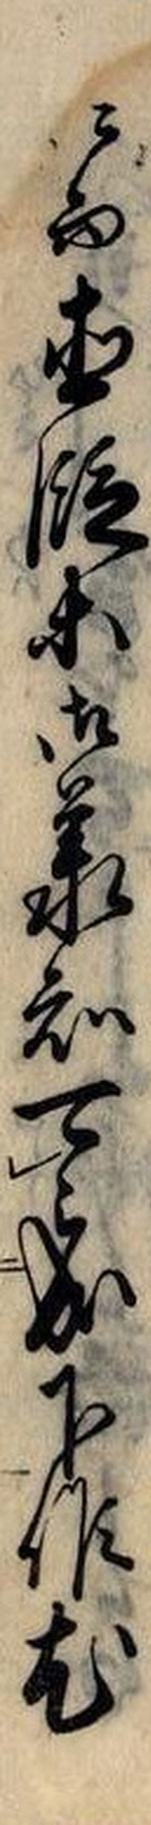に而直段等御承知可被成下候尤
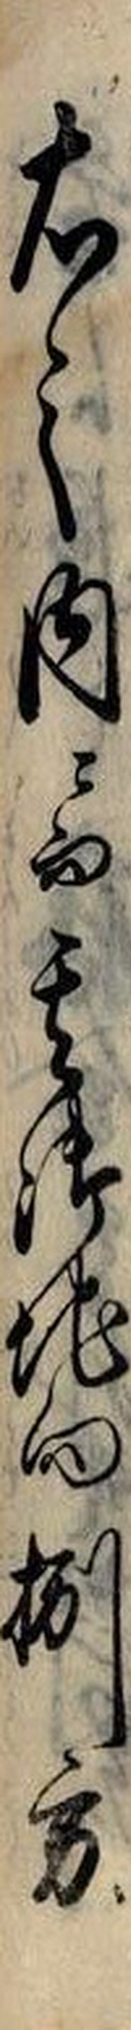右之内に而其御地向捌方
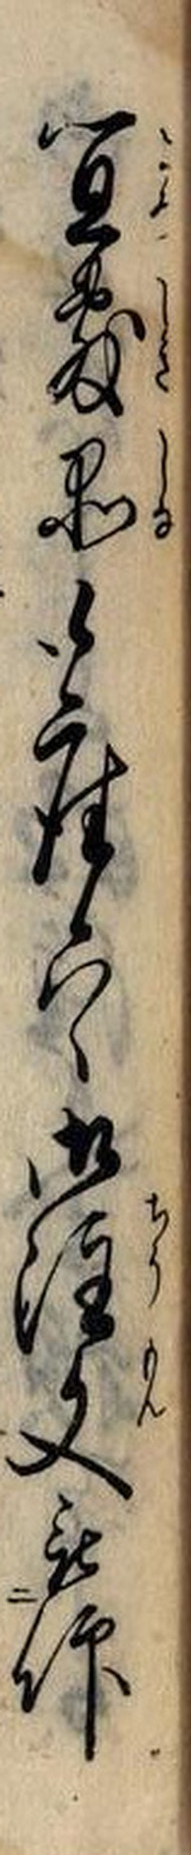宜敷品御座候はゝ御注文被仰
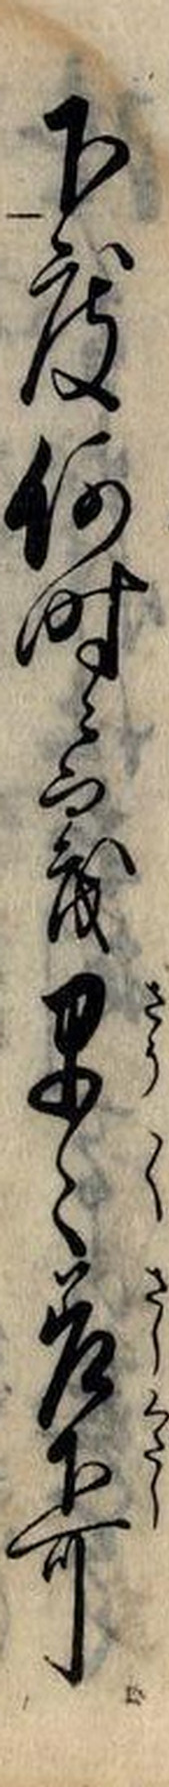下度何時に而も早々差下可
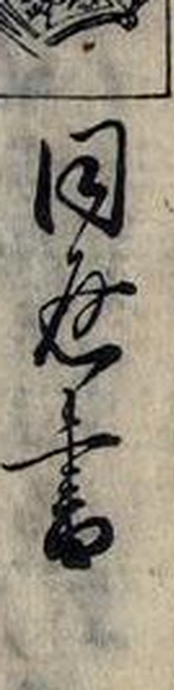同返書

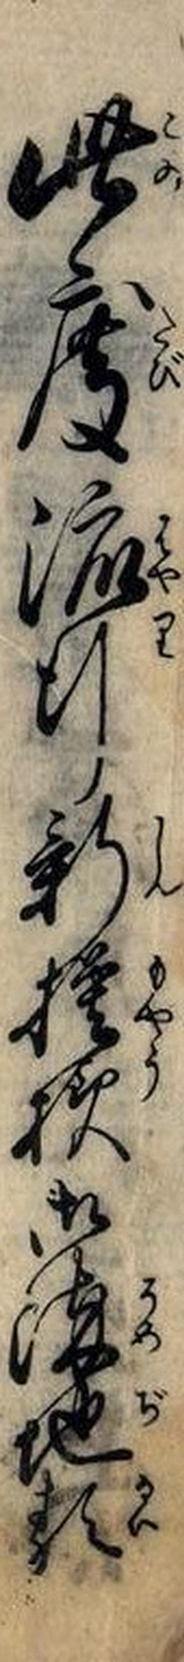此度流行新模様御染地類
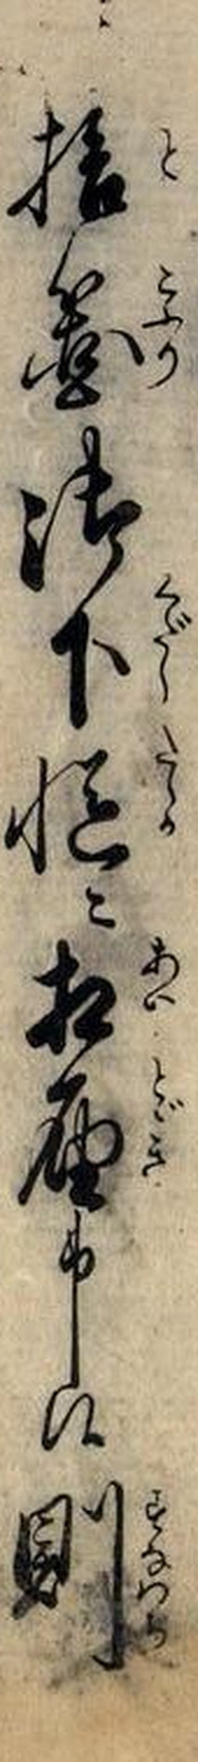拾箇御下慥に相届申候則
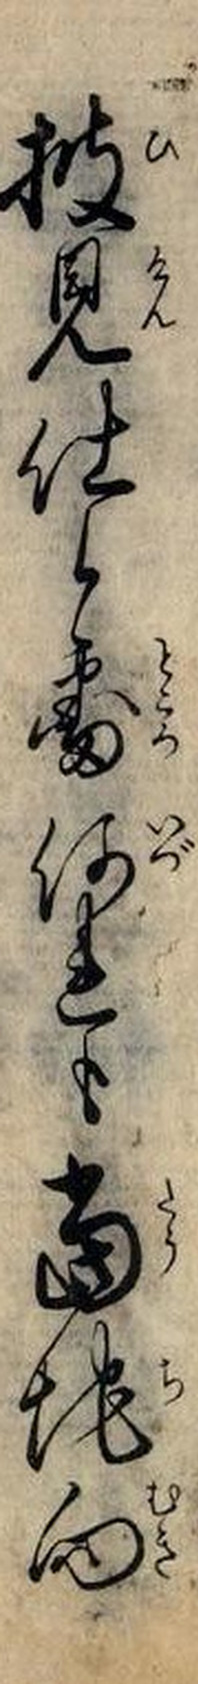披見仕候處何れも當地向
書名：大成用文章（往来物）
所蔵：福井県文書館 Fukui Prefectural Archives
